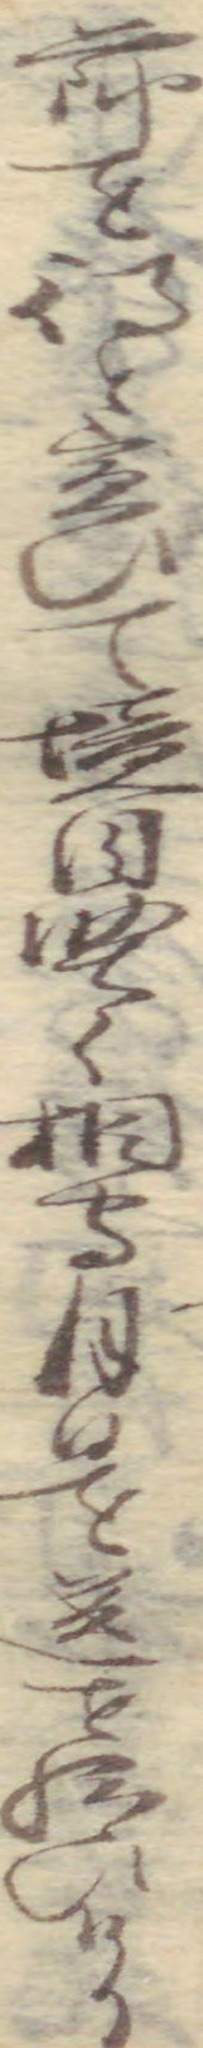節を待と宣ひて境目堅く相守月日を送せ給ひけり
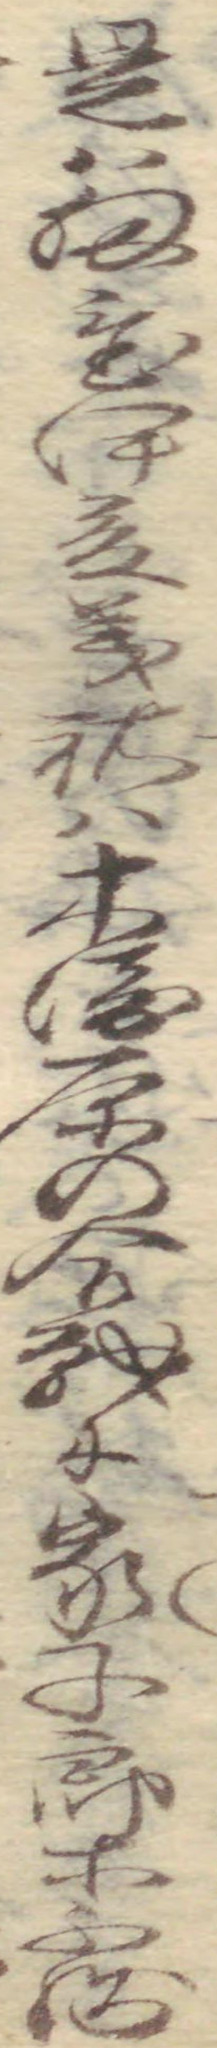是は扨置伊藤義祐は木崎原の合戦に家子郎等不残
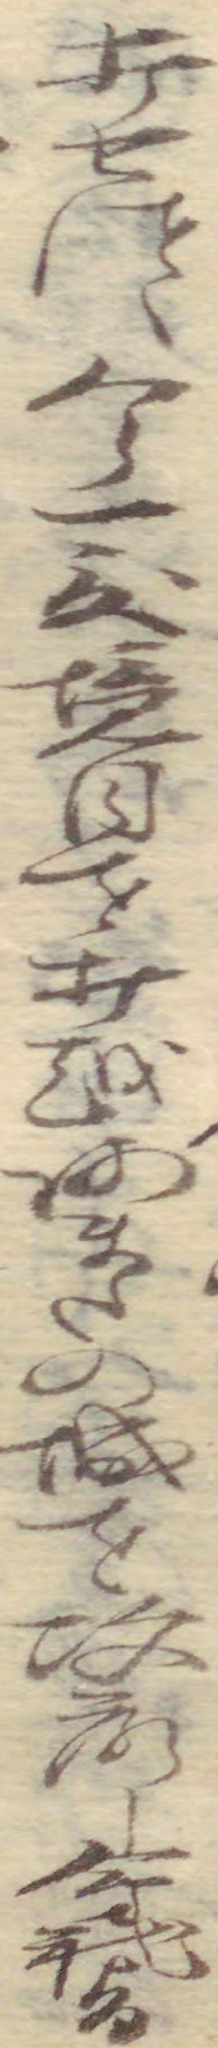打せつゝ今一度境目を打越あまたの城を攻落し会稽
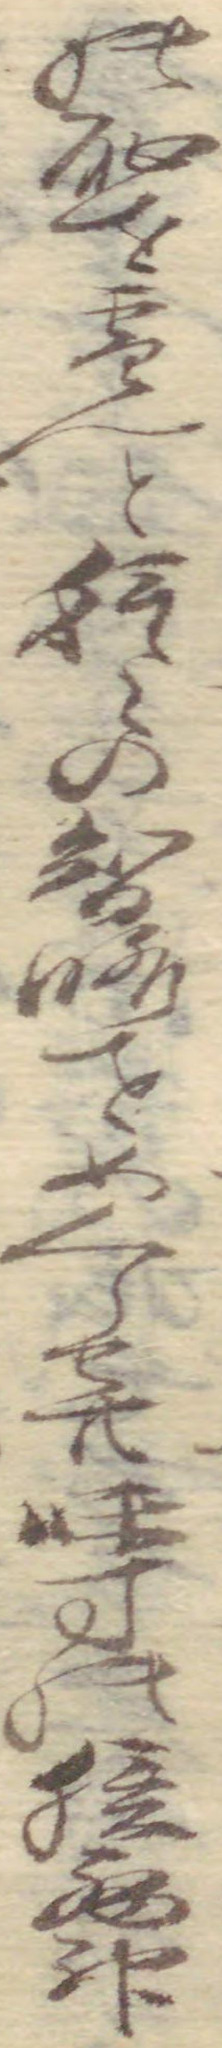の恥を雪んと種々の智略をめくらせ共味方の臆病神
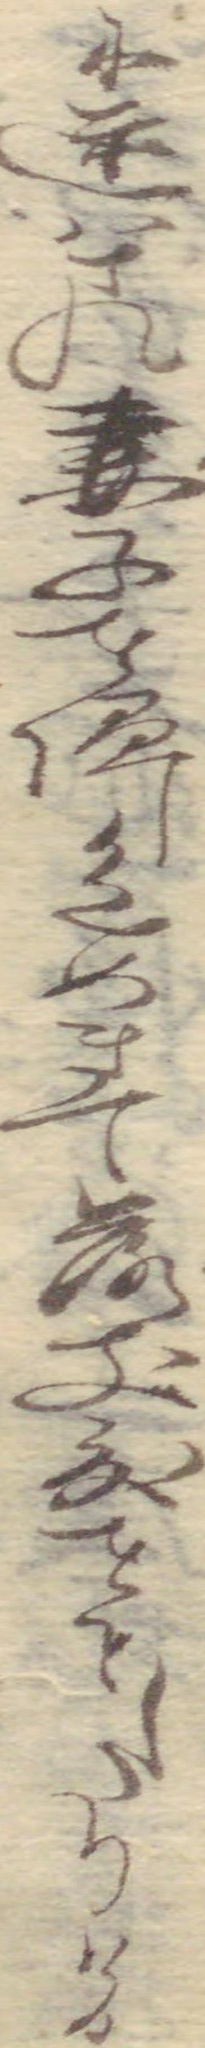に迷はされ妻子を隠し色めきて落支度をそしたりける
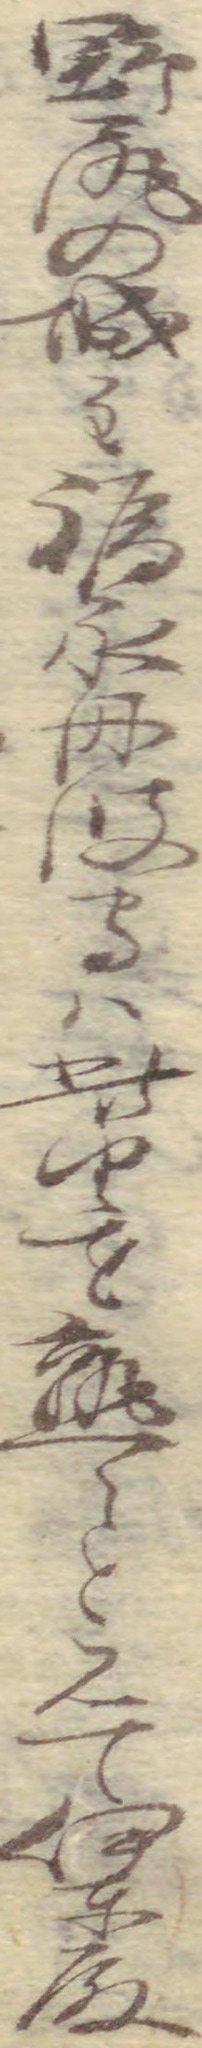野尻の城主福永丹波守は此由を熟しと見て伊東殿
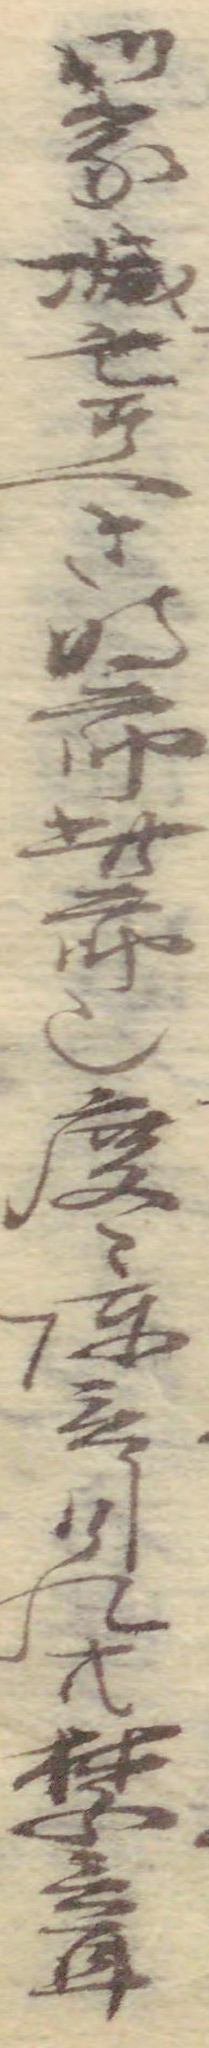御家滅亡すへき時節此節也度々諫言しけれ共禁言耳
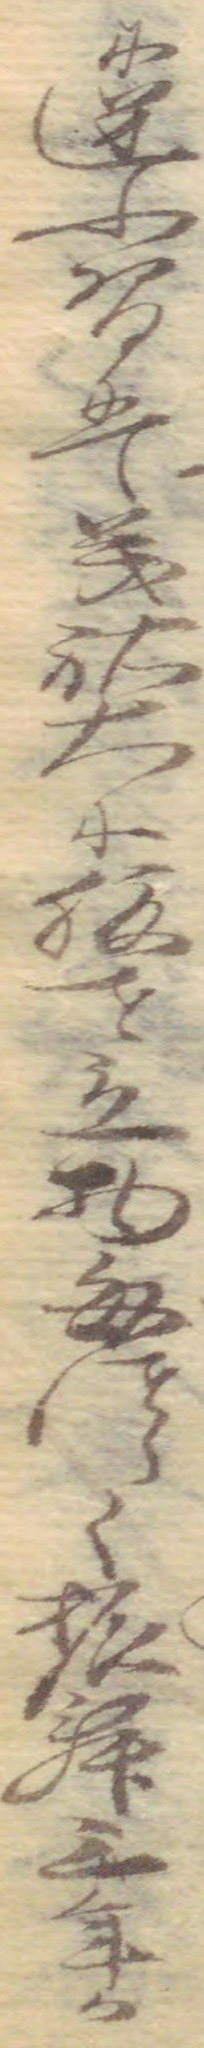に逆ふ習にて義祐大に腹を立物毎つらく振舞三年か

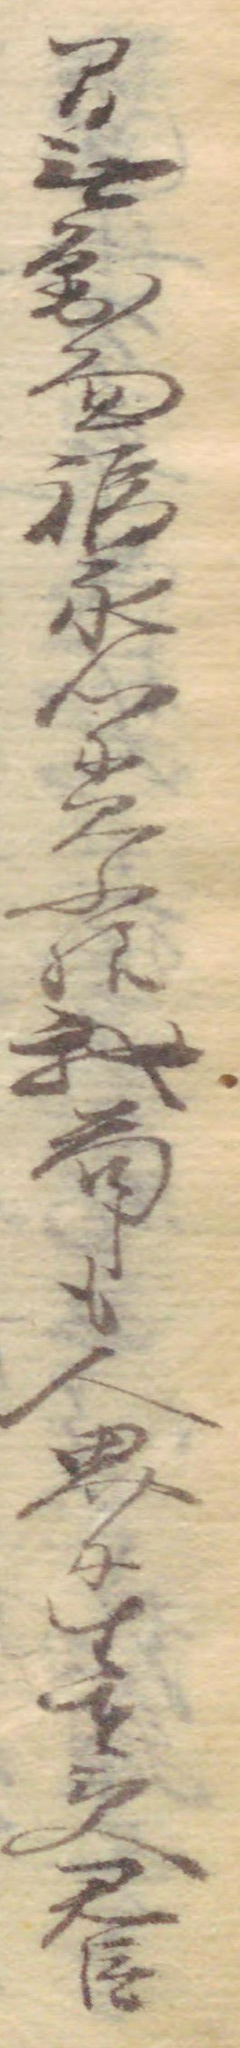間無対面福永心に思ふ様我苟しも人界に生を受君臣
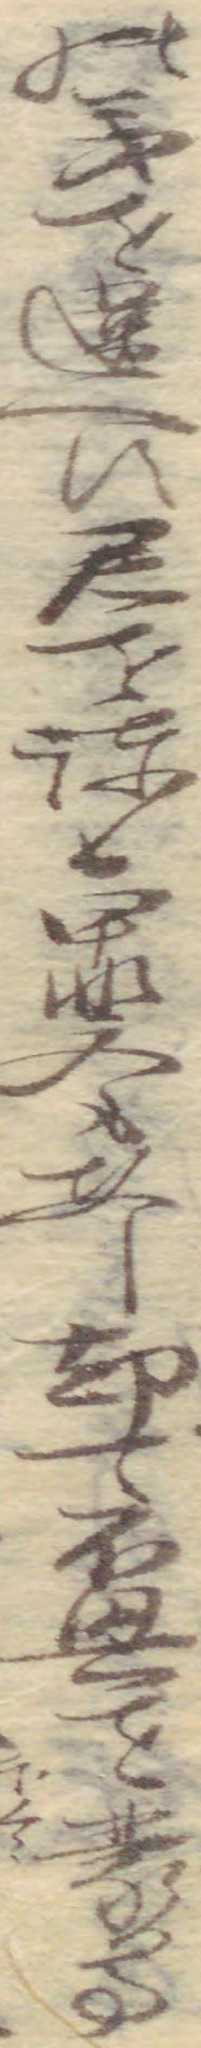の義を違へす君を諌る甲斐もなし却て不興を蒙る事
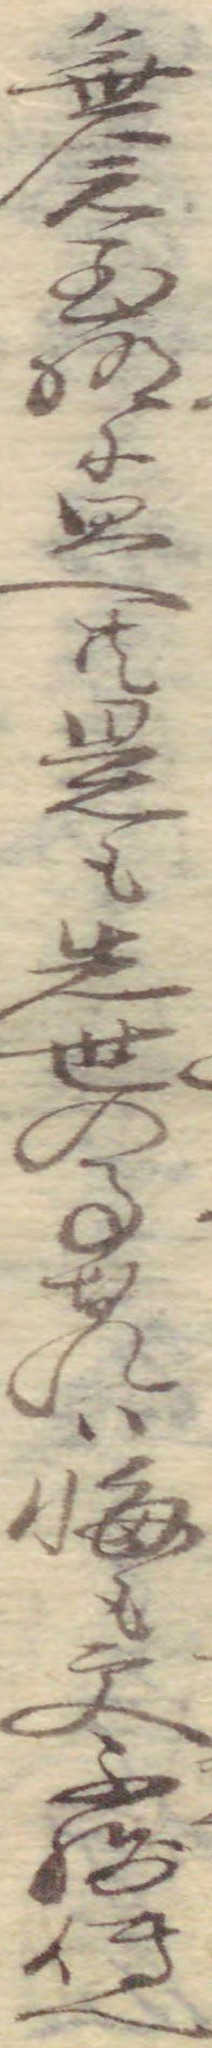無念至極に思へ共是も先世の事なれは悔も更不残伝へ
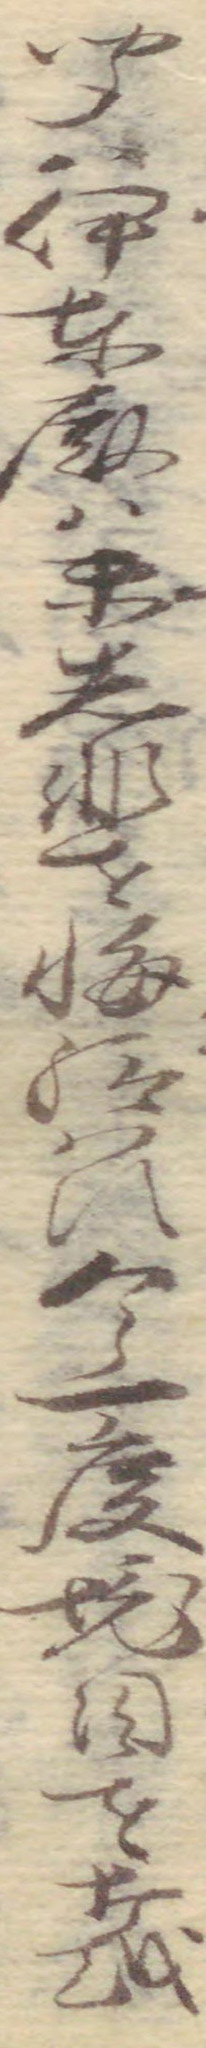聞は伊東殿は未先非を悔給はす今一度境目を打越
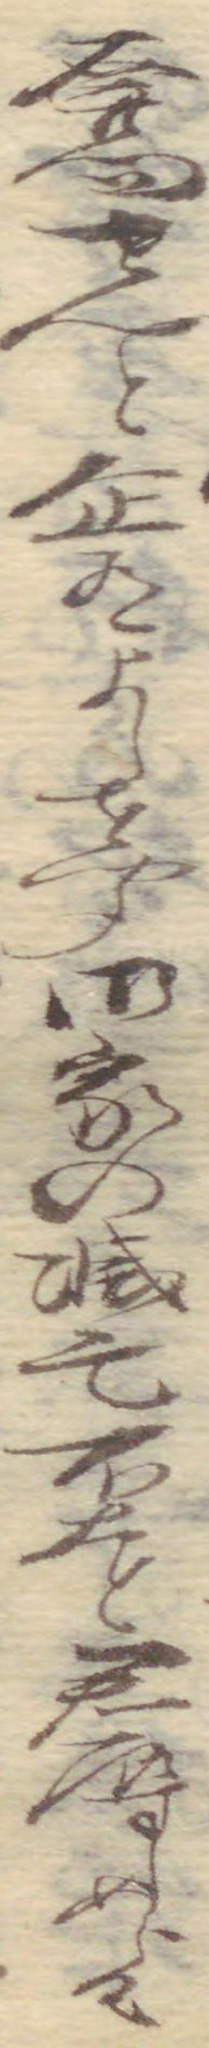発向せんと企有よしを聞御家の滅亡不遠君辱しめらるゝ
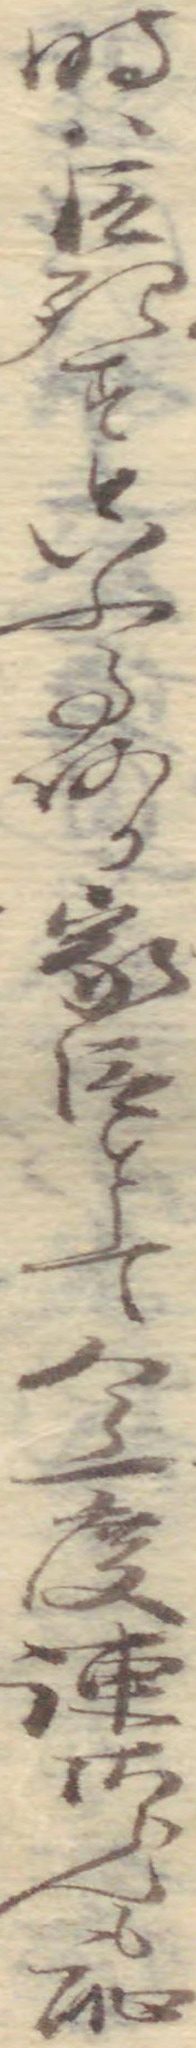時は臣死すといふ事あり家臣として今一度諌さらんも恥
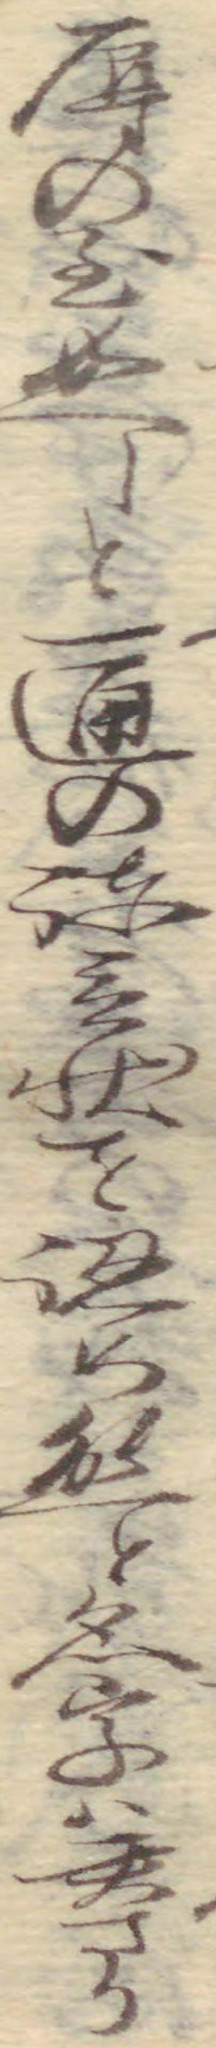辱の至成へしと一通の諌言状を認め態と名字は書さり
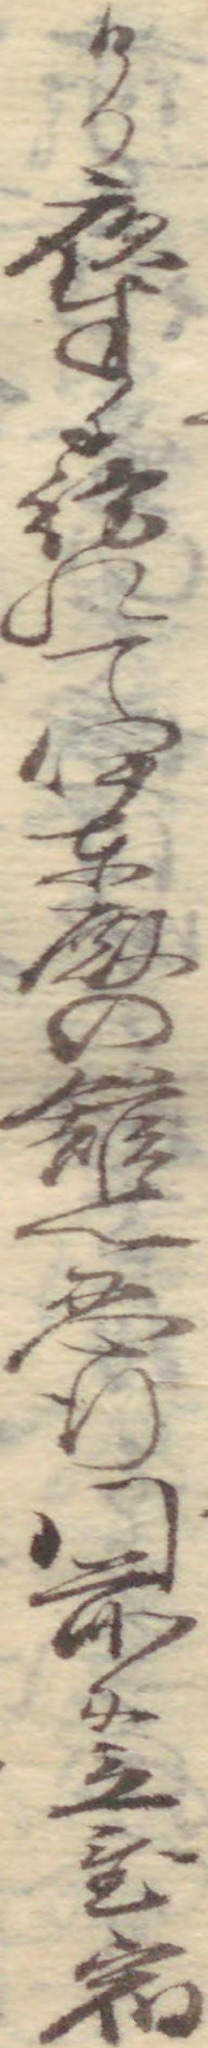けり夜半に紛れて伊東殿の館へ忍行門前に立置宿
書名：鶯宿雑記. 巻199-200
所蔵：国立国会図書館 National Diet Library, JAPAN
